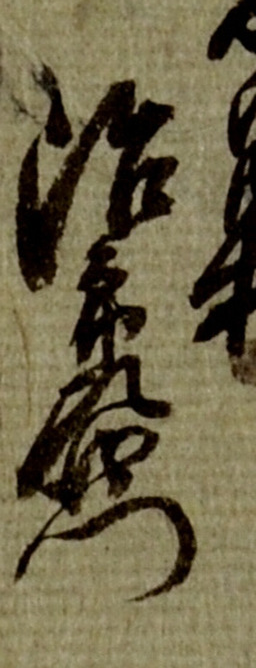治郎左衛門
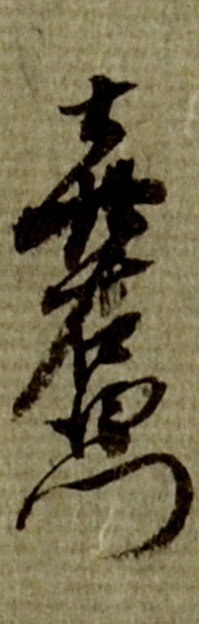喜右衛門
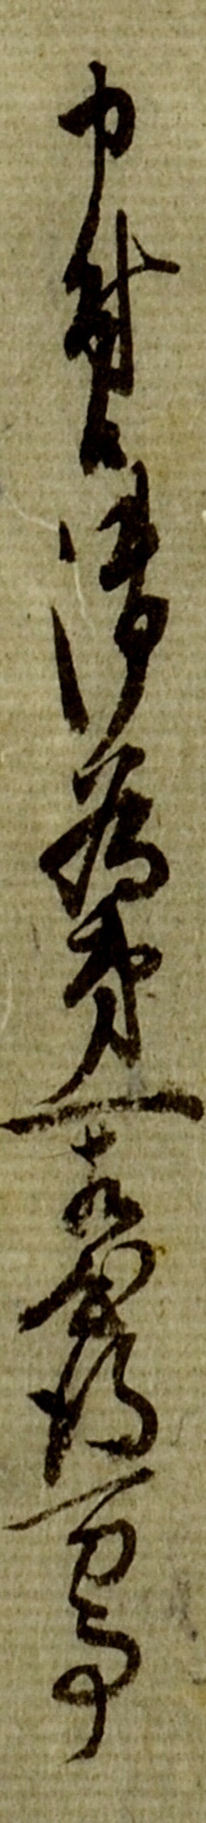申付候御為第一相心得万事
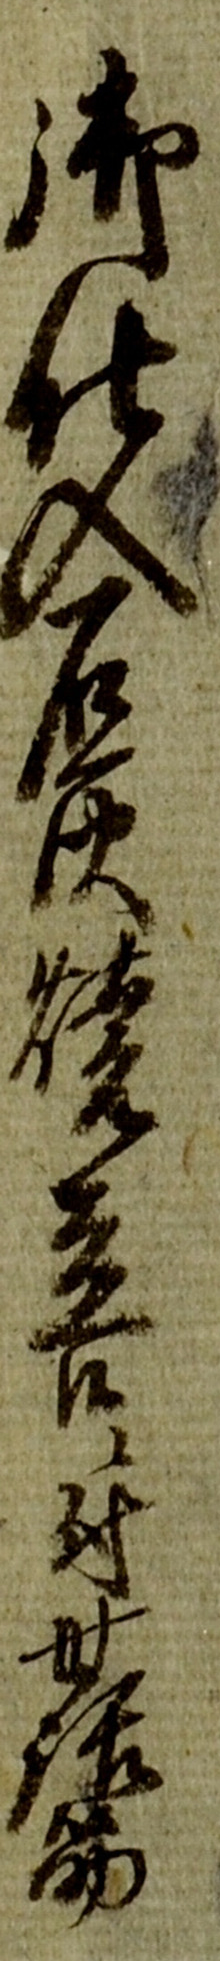御仕入石灰焼立候ニ付世話筋
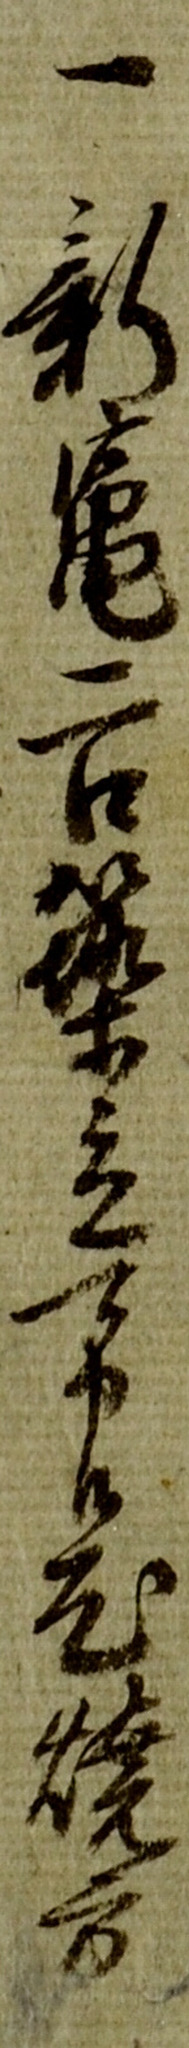一新竃二口築立可申候尤焼方
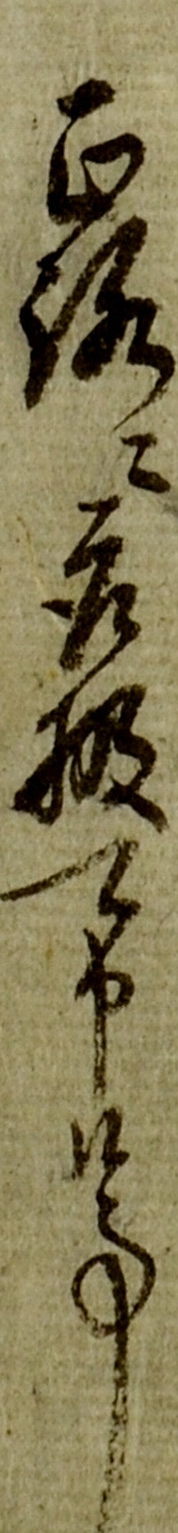正路ニ取扱可申候事
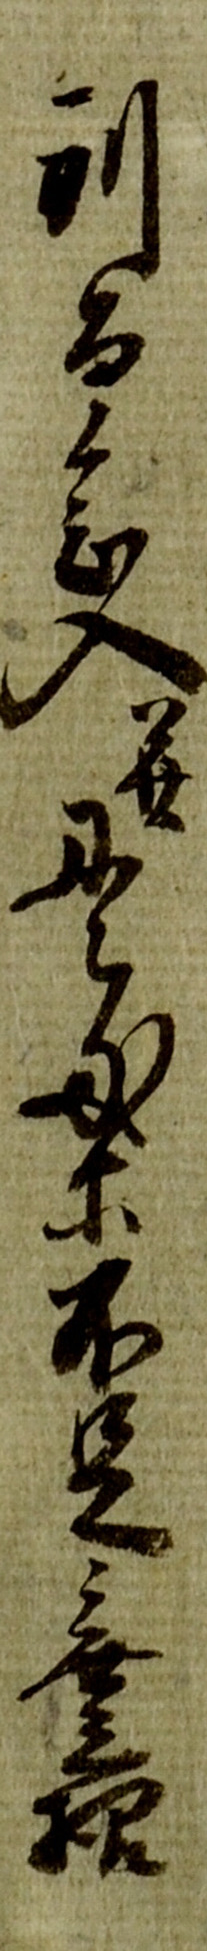別而念入并貫両不足ニ無之様
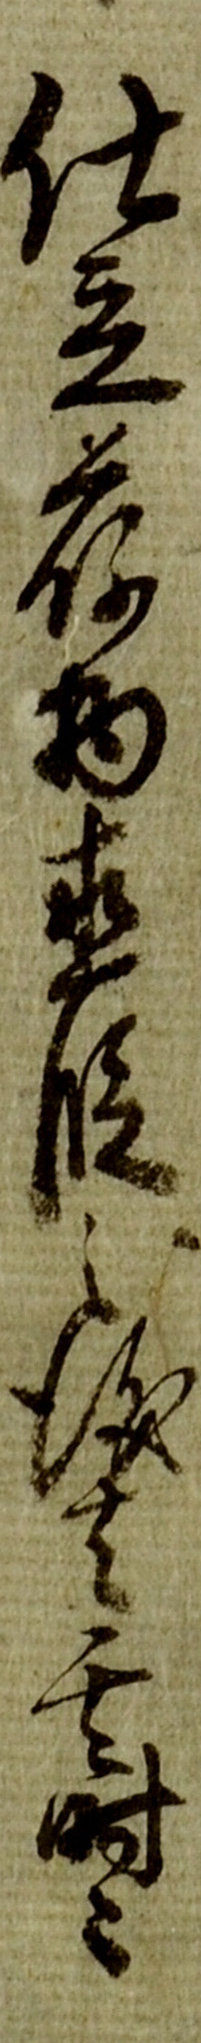仕立荷物直段之儀者其時々
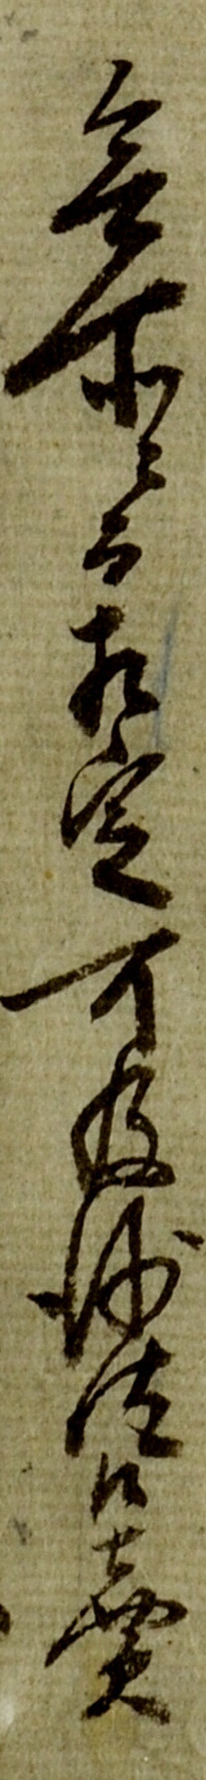会所ニ而相定可及沙汰候売
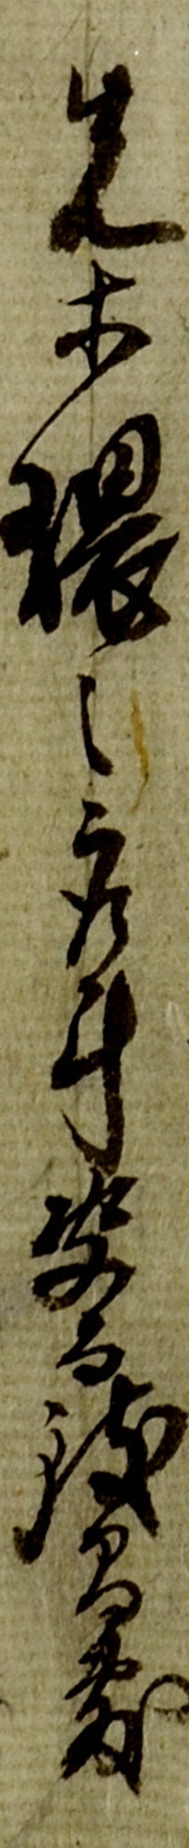先等猥之取斗決而致間敷
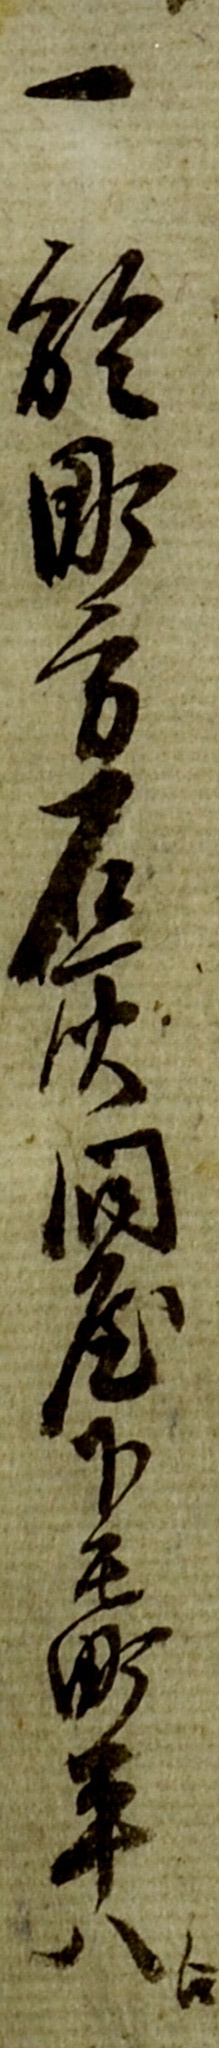一於町方石灰問屋下モ町平八江
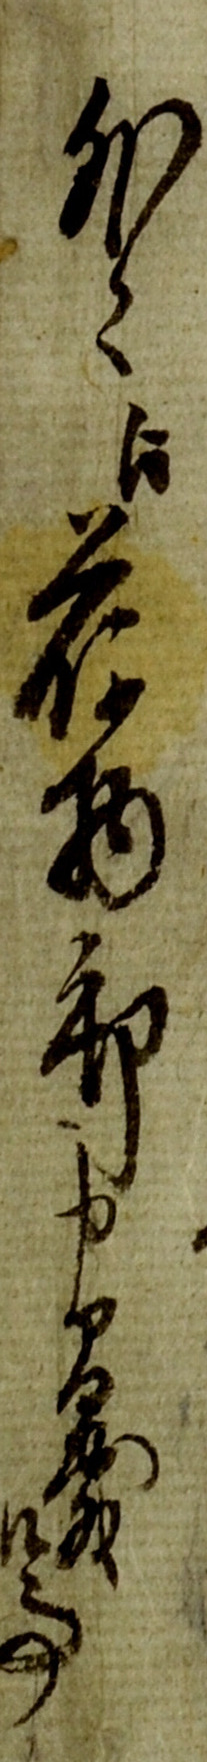外々江荷物卸申間敷候事
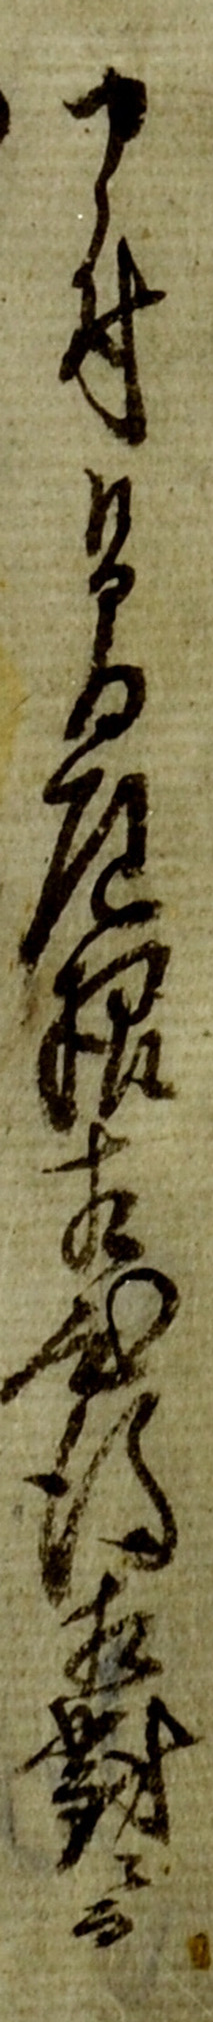申付候間左様相心得相対ニ而
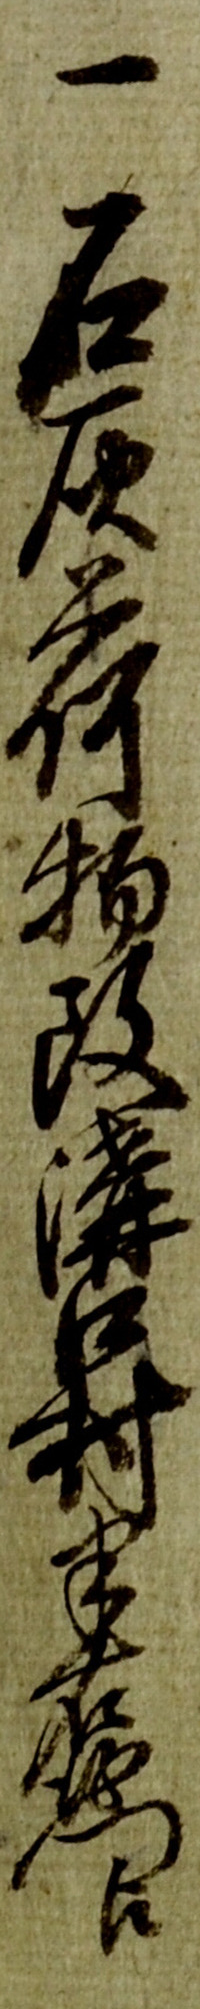一石灰荷物改溝口村半右衛門江
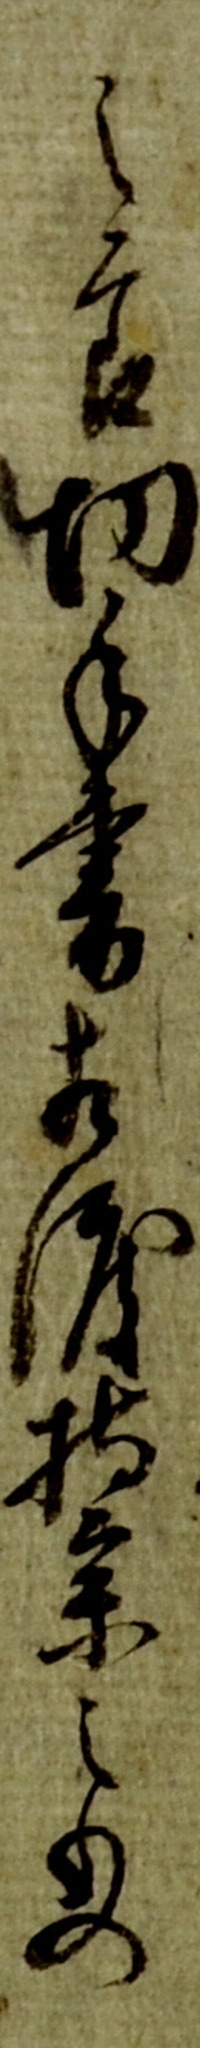之節切手書相渡持参之もの
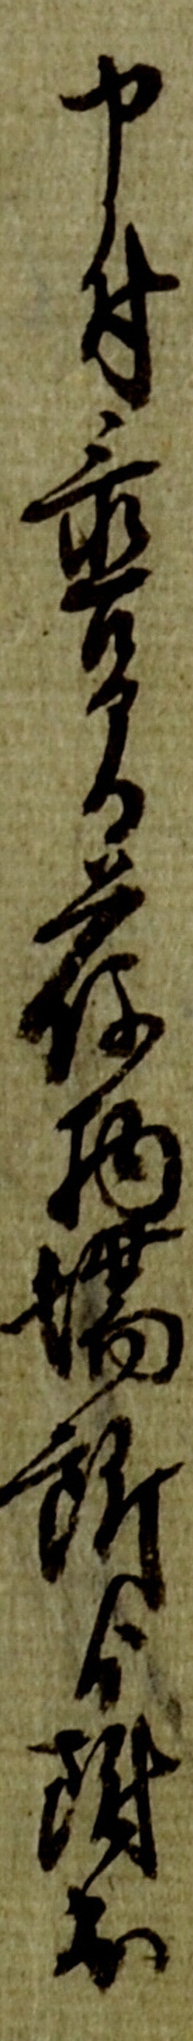申付置候間荷物場所ゟ附出
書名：覚
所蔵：伊那市立高遠町図書館・合同会社AMANE
